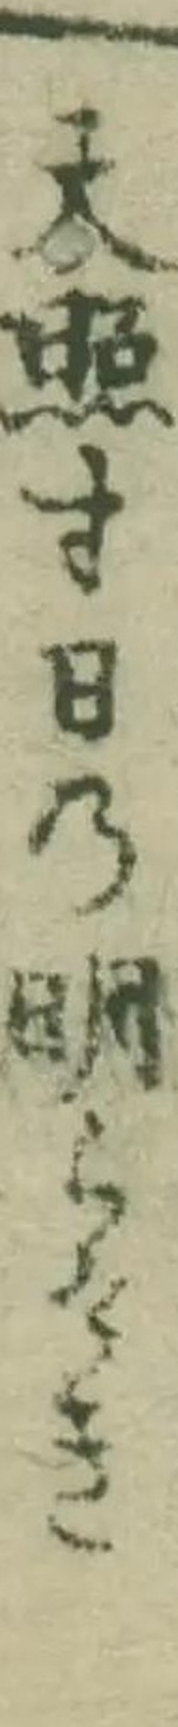天照す日の明らけき
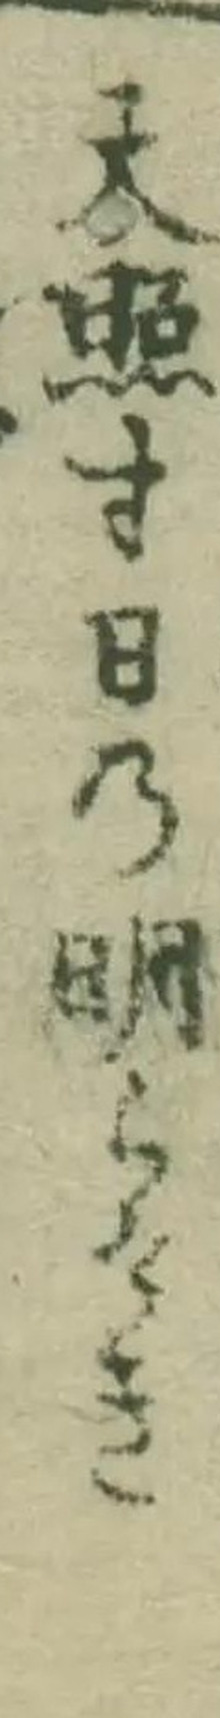天照す日の明らけき
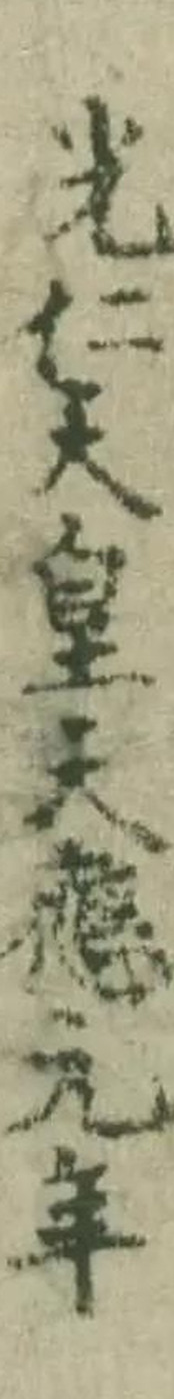光仁天皇天應元年
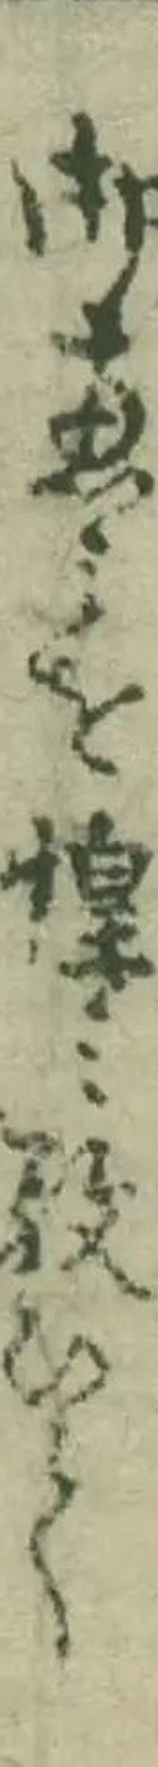御恵みを惶み敬ひて
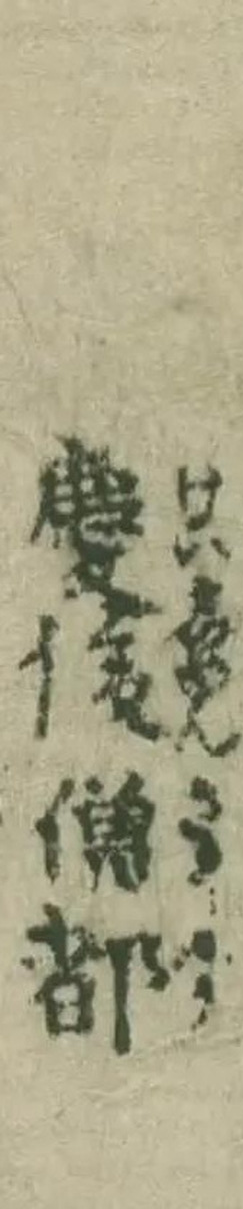慶俊僧都
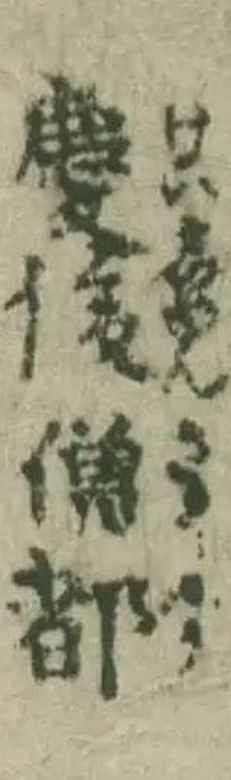慶俊僧都
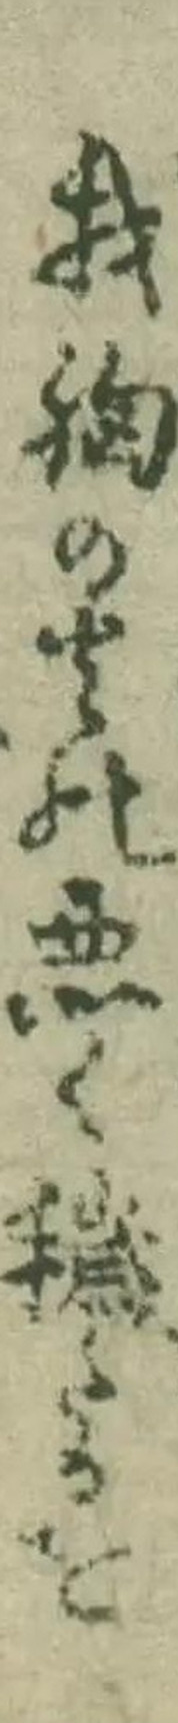我胸の火の悪く穢たるを
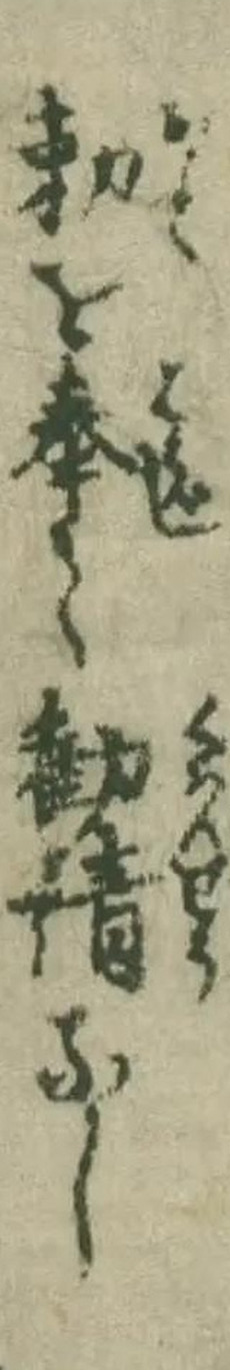勅を奉て勧請なし
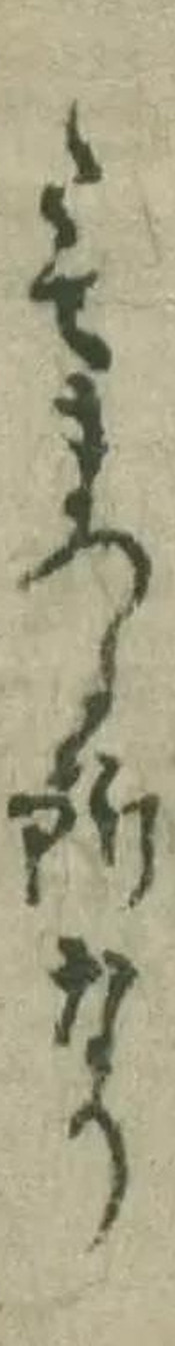たてまつる所なり
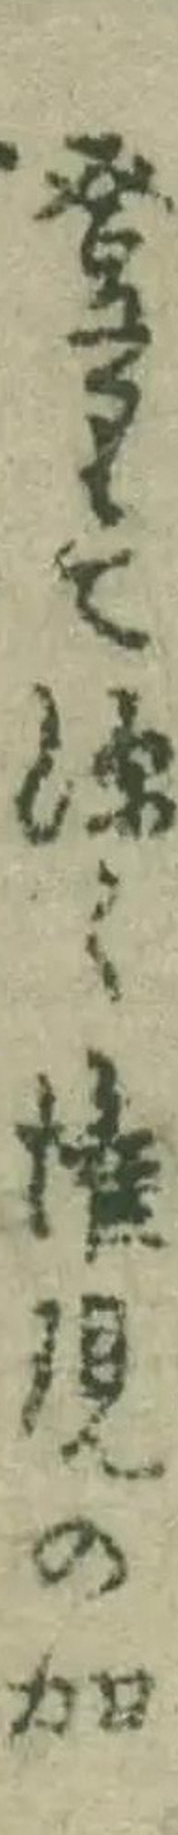登りて深く権現の加
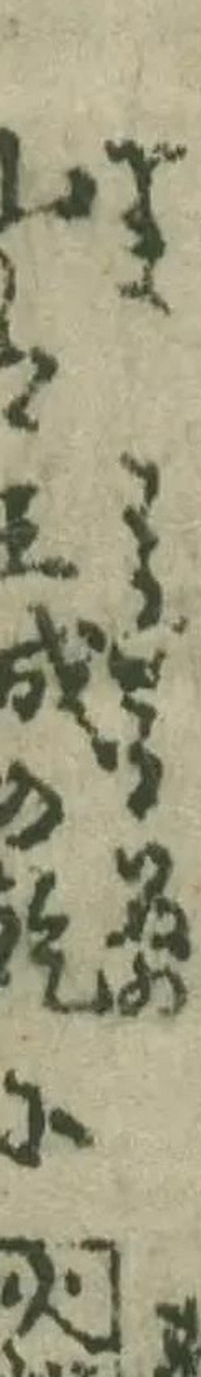山は王城の乾に
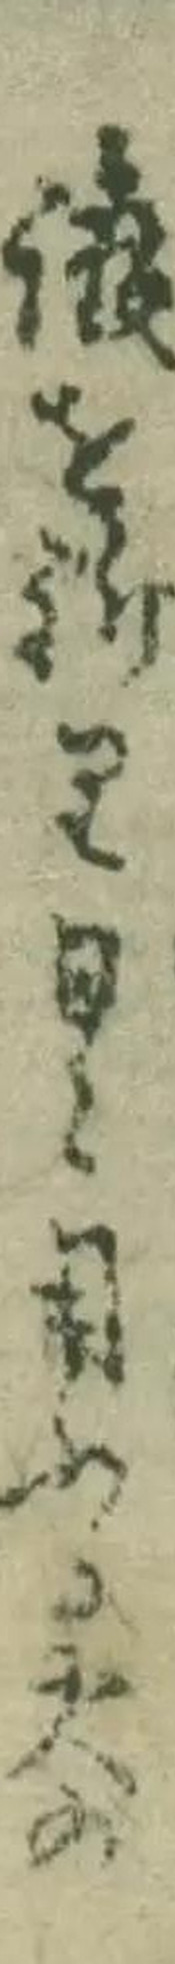護を祈り日〳〵用ふる火の
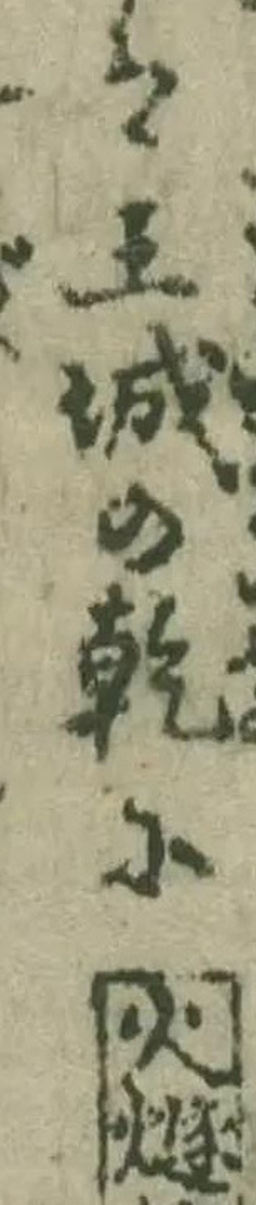山は王城の乾に
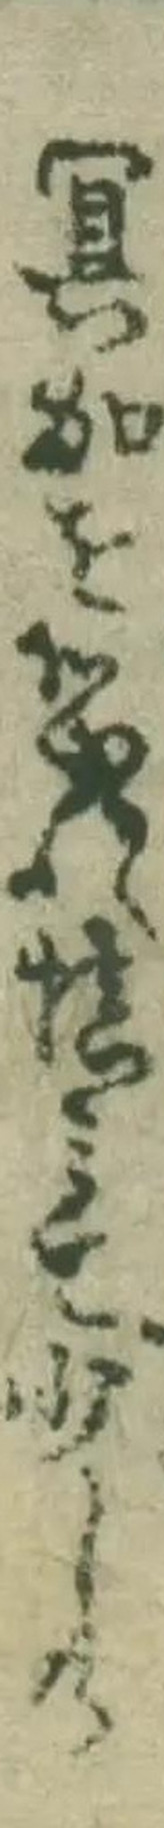冥加を恐れ慎みて少しの
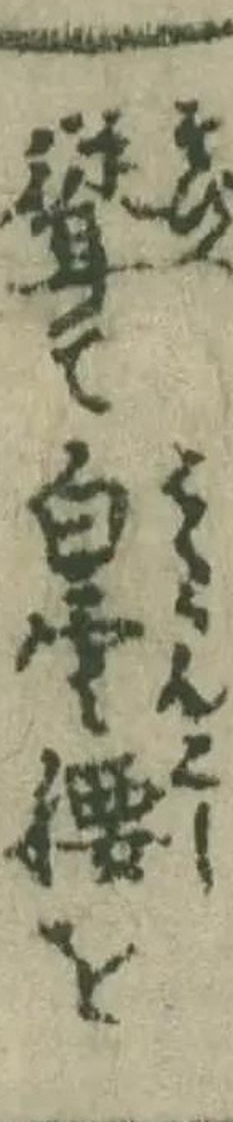聳て白雲腰を
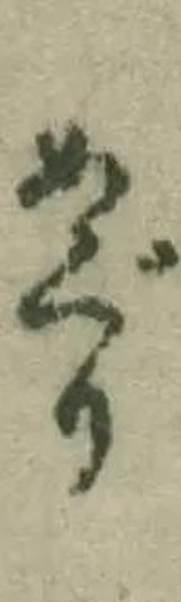めぐり
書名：信濃國六郡大地震滿水之圖
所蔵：国立国会図書館 National Diet Library, JAPAN
